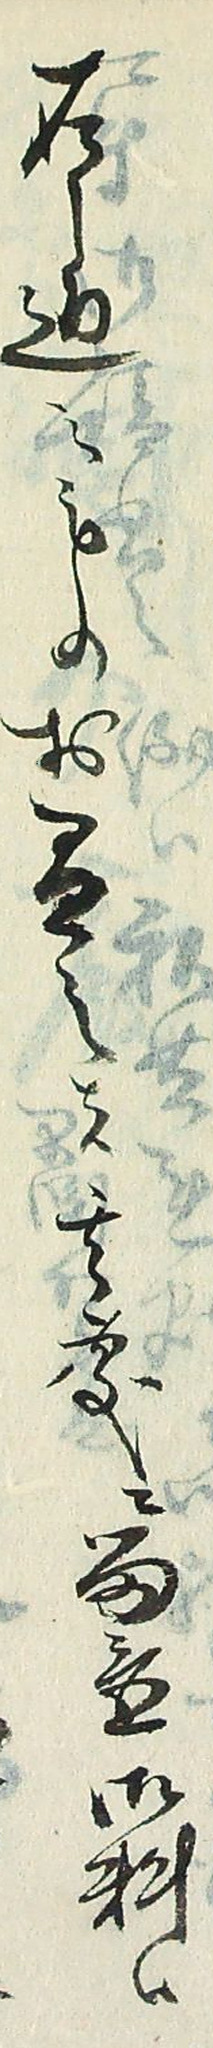右之通之もの於有之は其処に留置御料は
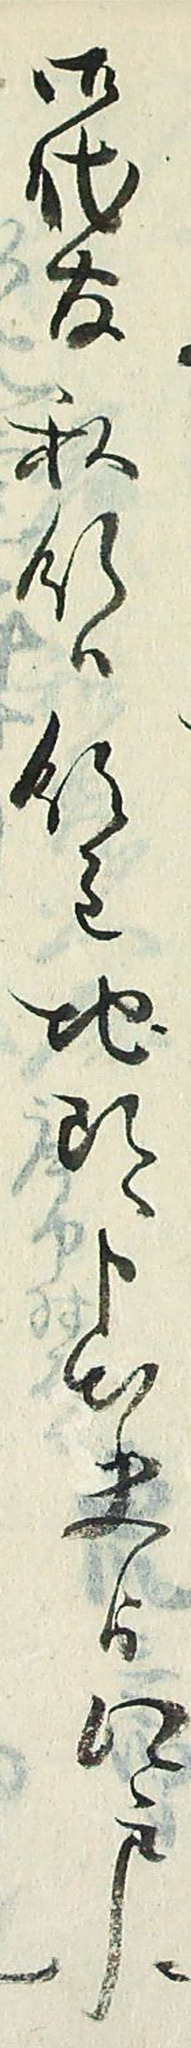御代官私領は領主地頭へ申出夫ゟ江戸に
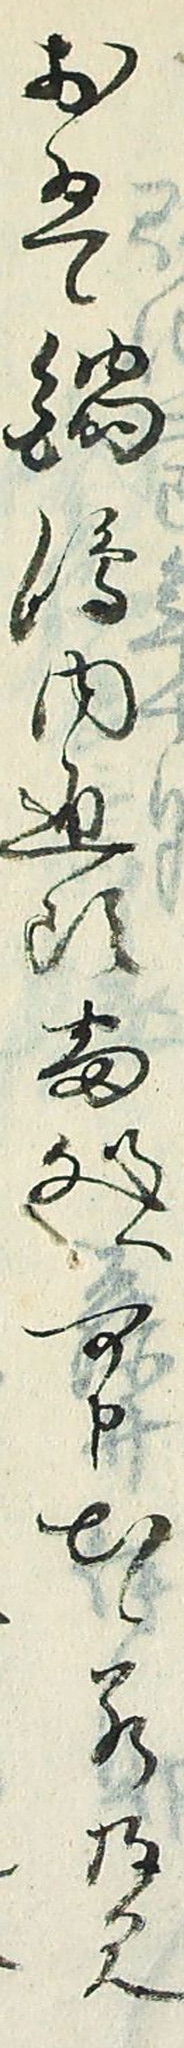おゐて鍋嶋内匠頭番処へ可申出候若及見
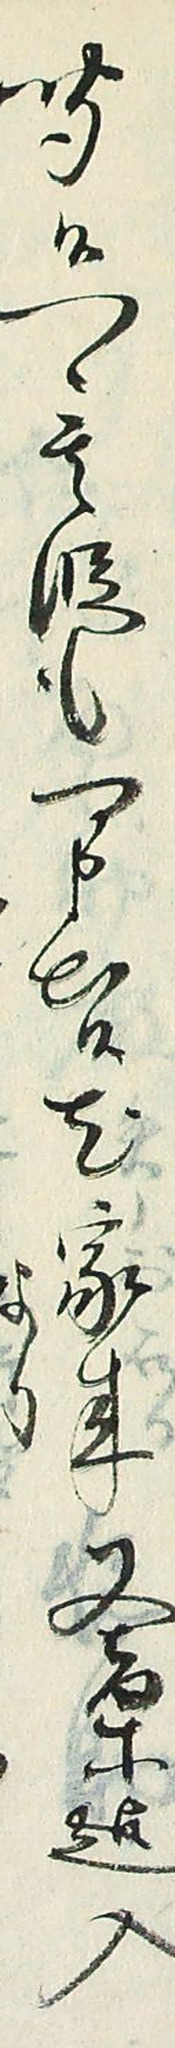聞候はゝ其段も可申出候尤家来又者等迄入
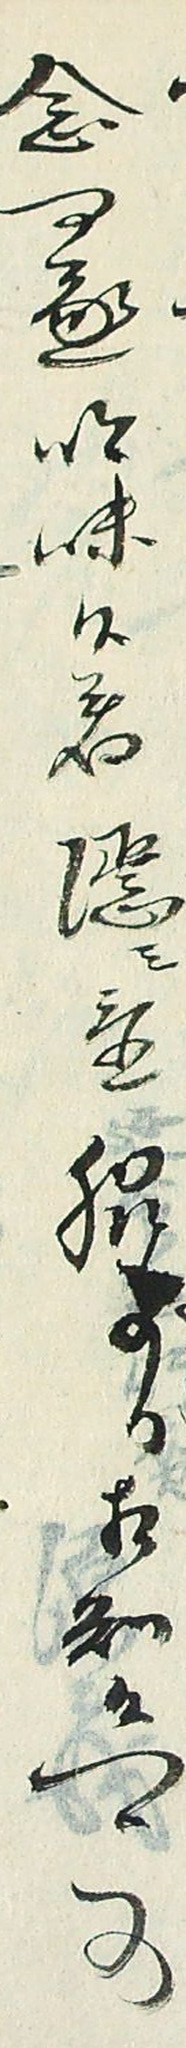念可遂吟味候若隠し置脇よる相知候はゝ可

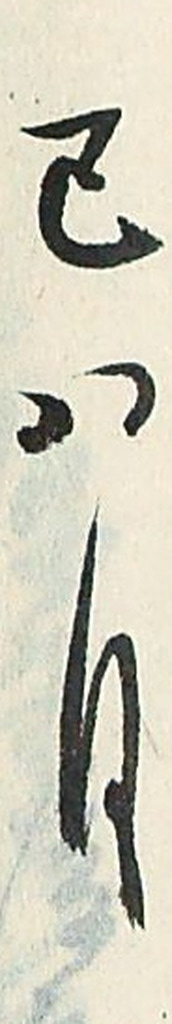巳八月
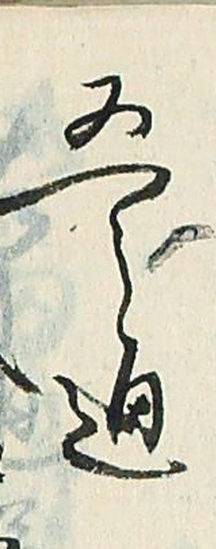右之通
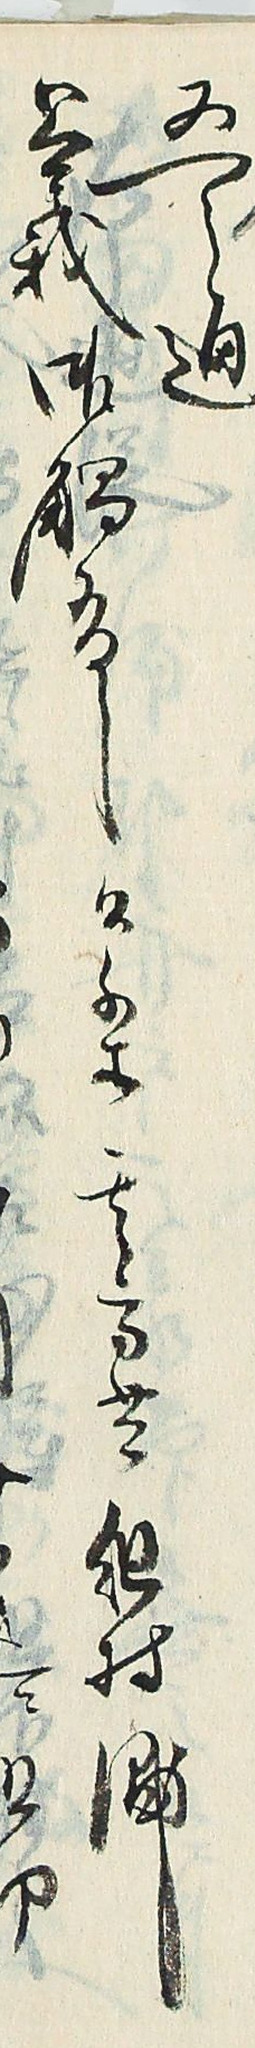公義御触有之候条其方共組村浦
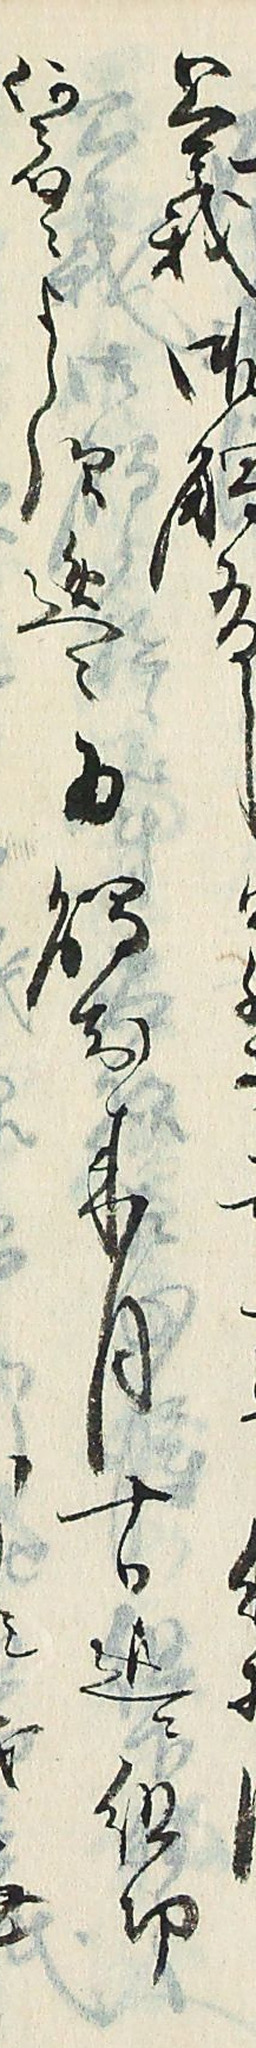何者によらす逸々為触知来月十日迄に組切
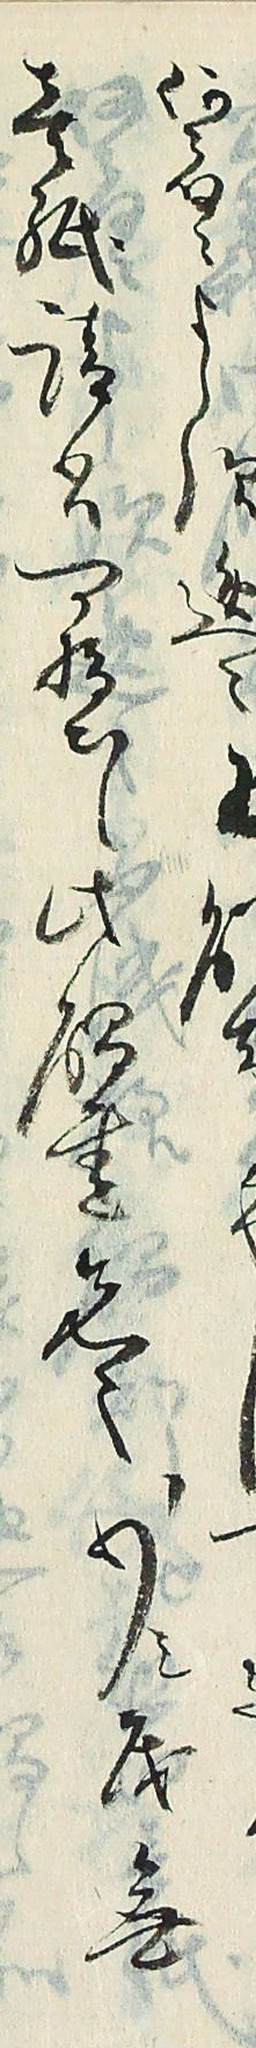壱紙請書可指出候此触書先々少しも無
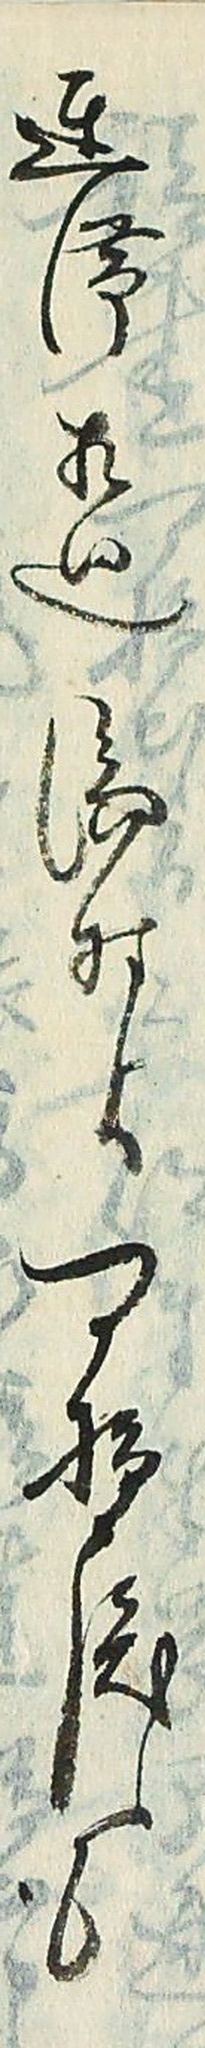遅滞相廻済村ゟ可指戻候以上
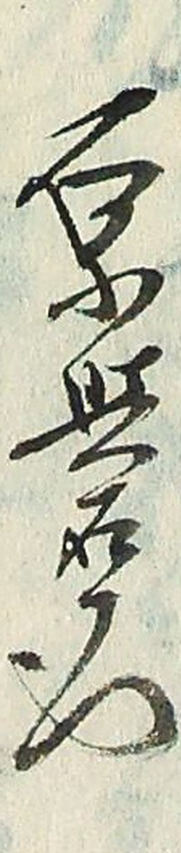原与右衛門
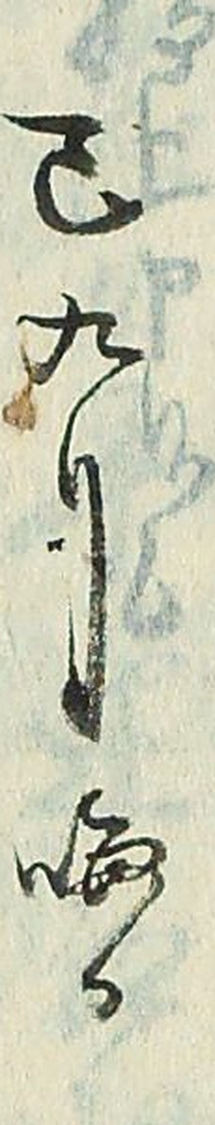巳九月晦日
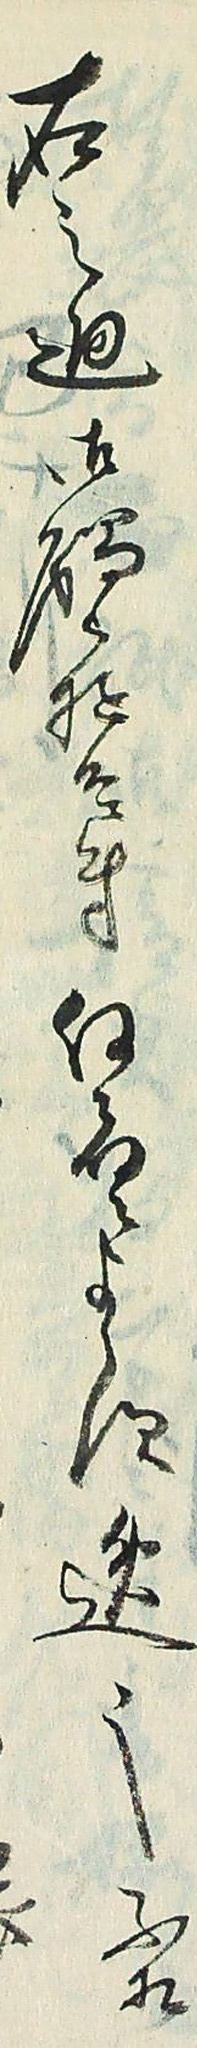右之通御触被遊候に付何者によらす逸々不相
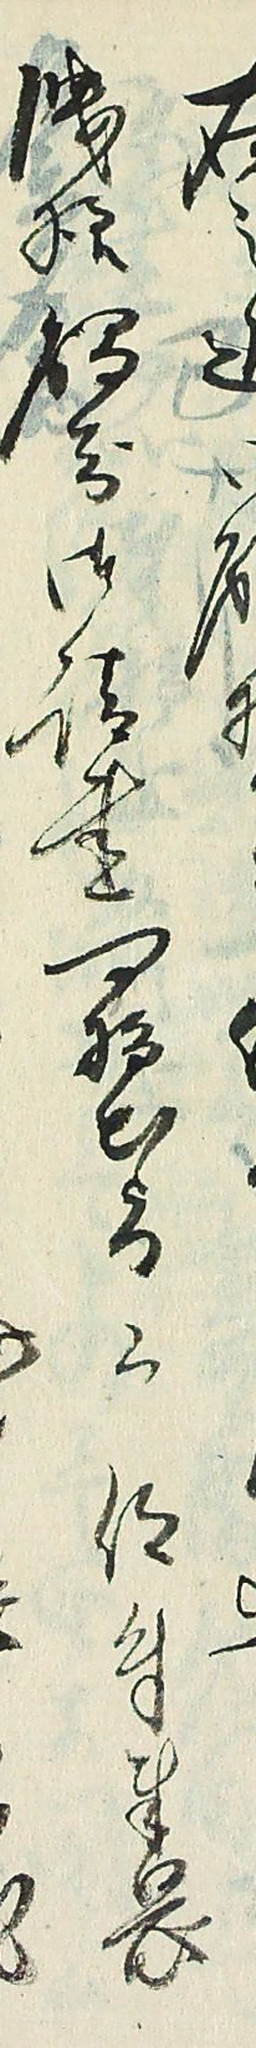洩様触知御請書可指出旨被仰付奉畏
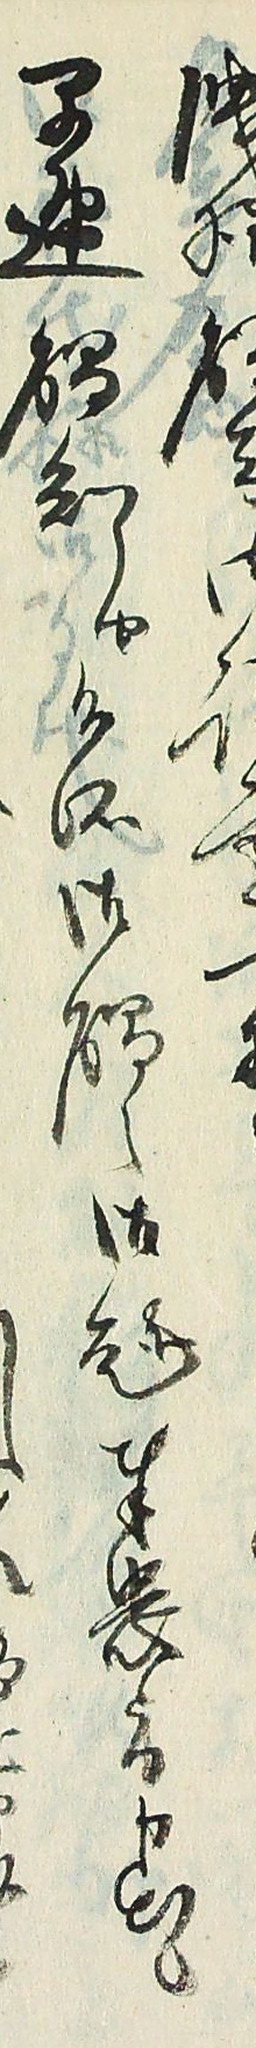早速触知せ候所御触之御趣奉畏旨申出候
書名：諸御用御□受書控
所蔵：鳴門教育大学 Naruto University of Education
